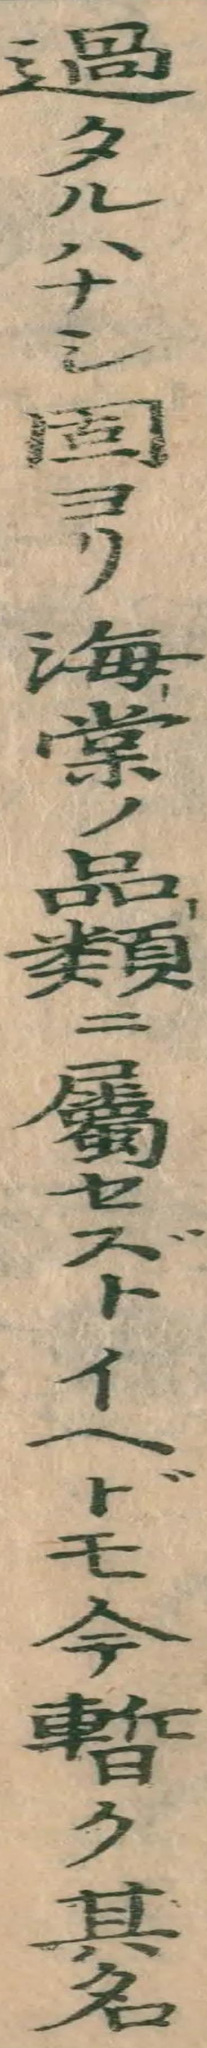過タルハナシ固ヨリ海-棠ノ品-類ニ属セズトイヘドモ今暫ク其名
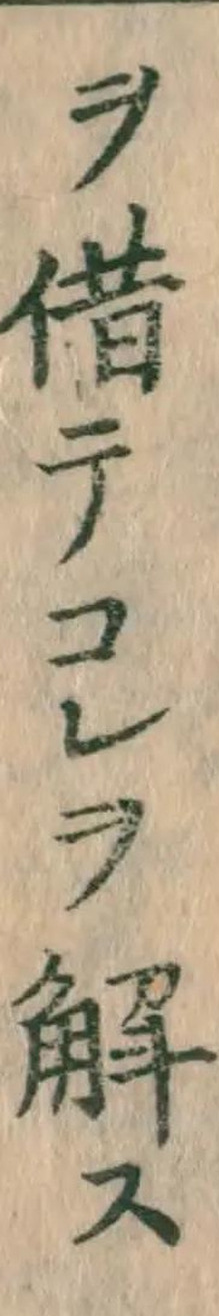ヲ借テコレヲ解ス
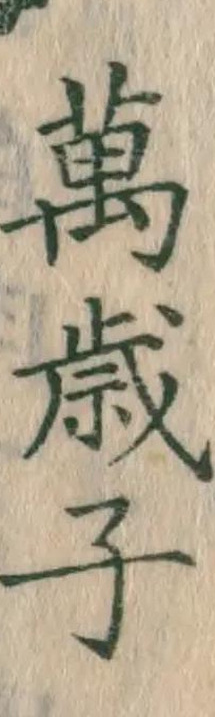万歳子

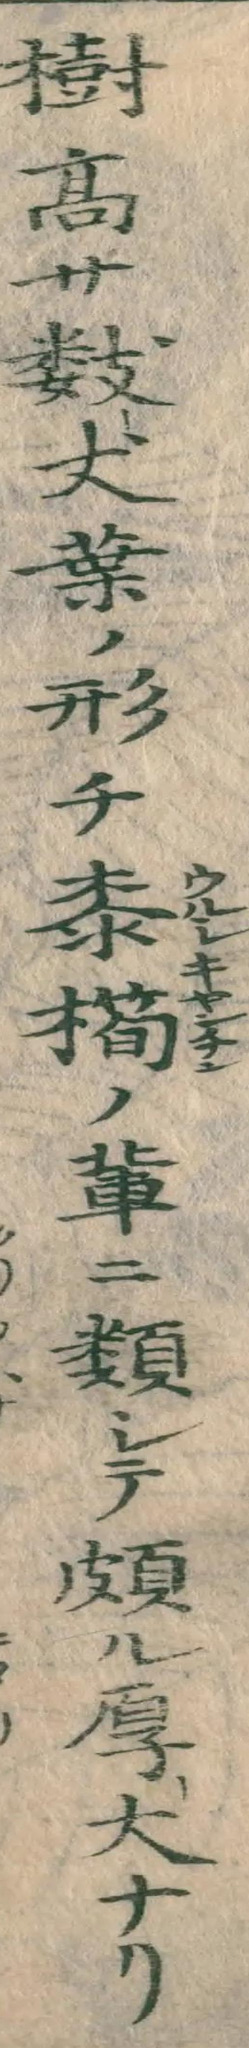樹高サ数-丈葉ノ形チ桼橁ノ輩ニ類シテ頗ル厚-大ナリ
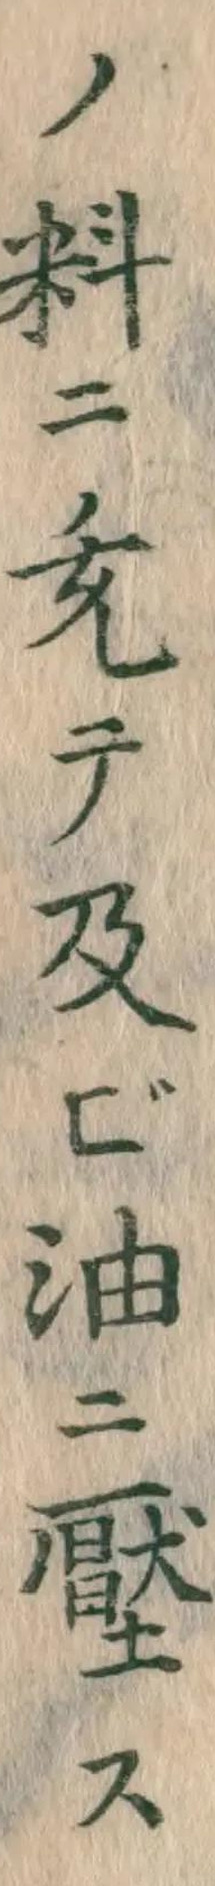ノ料ニ充テ及ビ油ニ圧ス

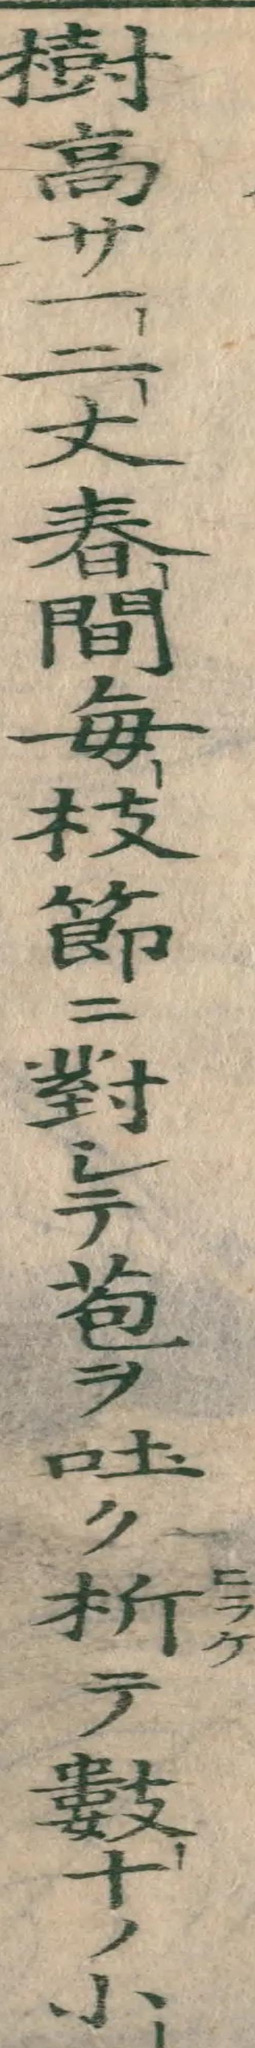樹高サ一-二-丈春-間毎-枝節ニ対シテ苞ヲ吐ク析テ数-十ノ小-
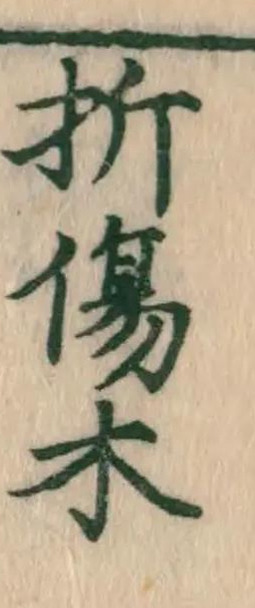折傷木

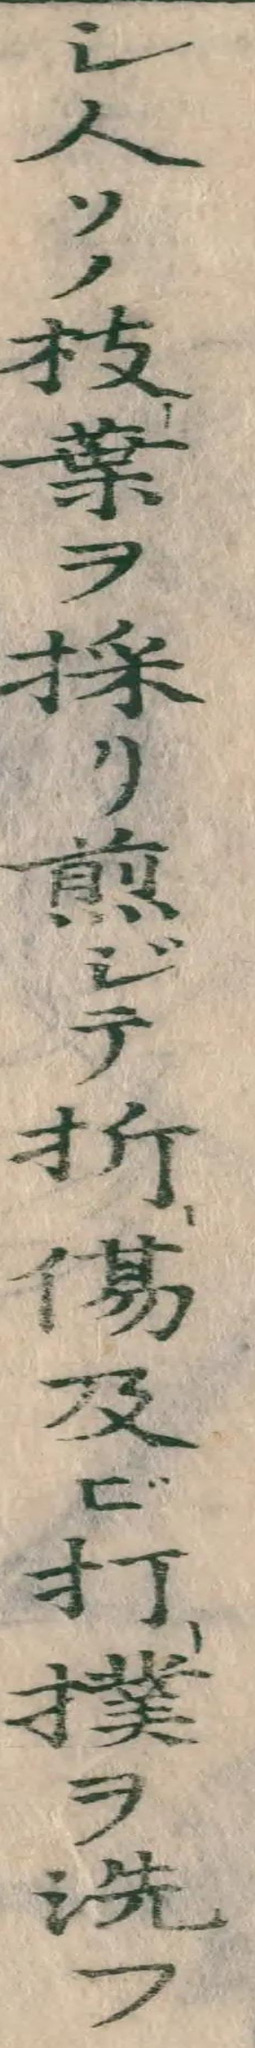シ人ソノ枝-葉ヲ採リ煎ジテ折-傷及ビ打-撲ヲ洗フ

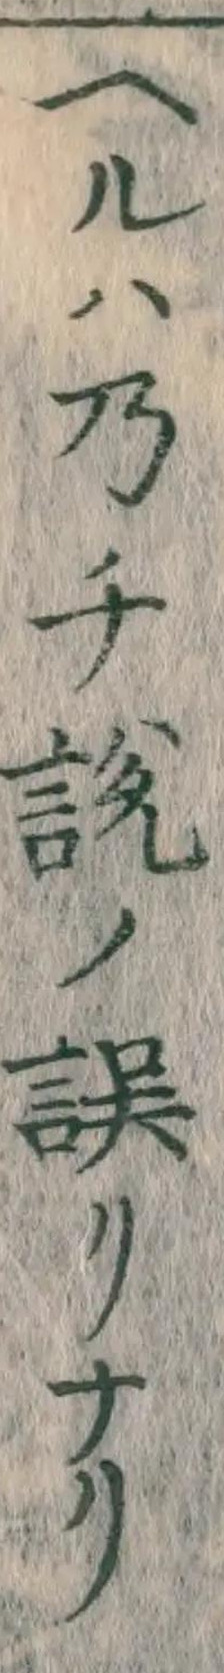ヘルハ乃チ説ノ誤リナリ

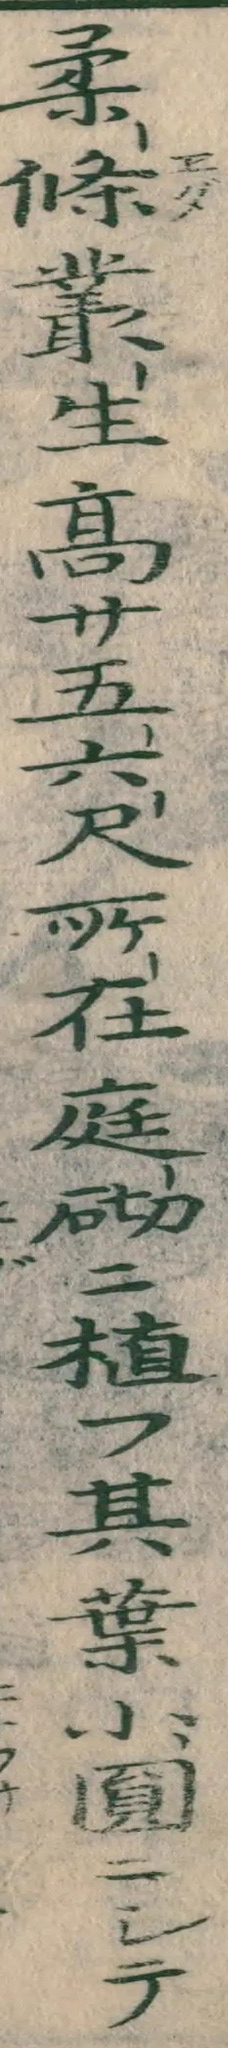柔-条叢-生高サ五-六-尺所-在庭-砌ニ植フ其葉小-円ニシテ
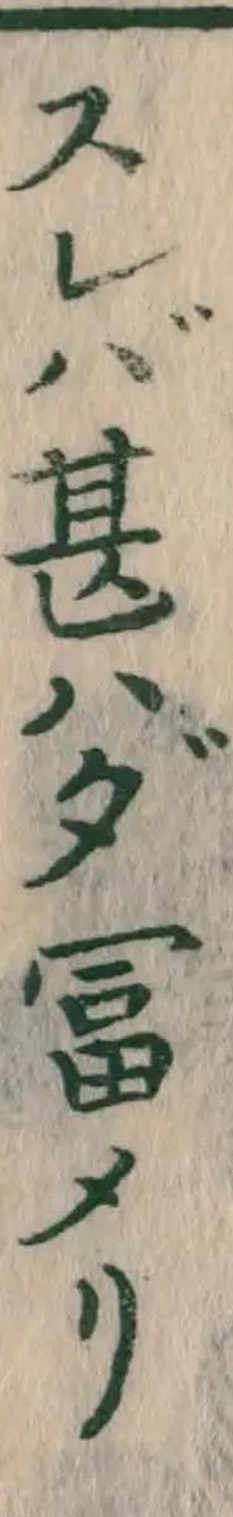スレバ甚ハダ富メリ

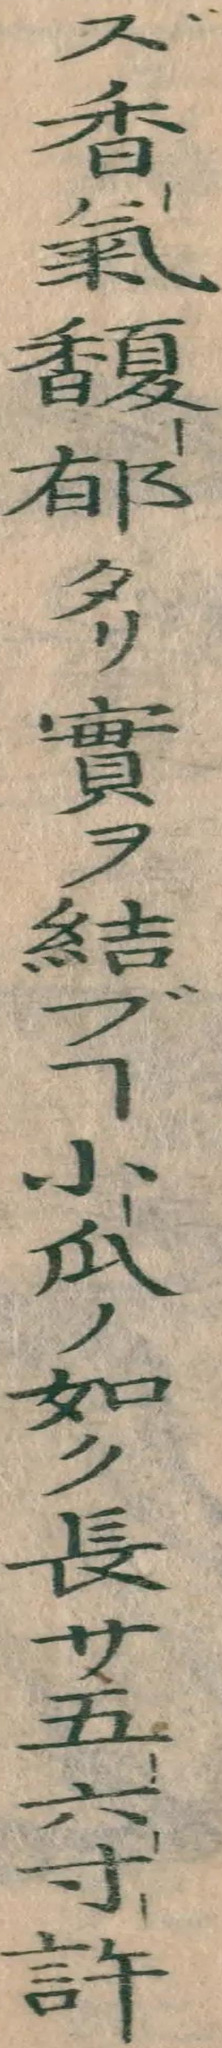ズ香-気馥-郁タリ実ヲ結ブヿ小-瓜ノ如ク長サ五-六-寸-許
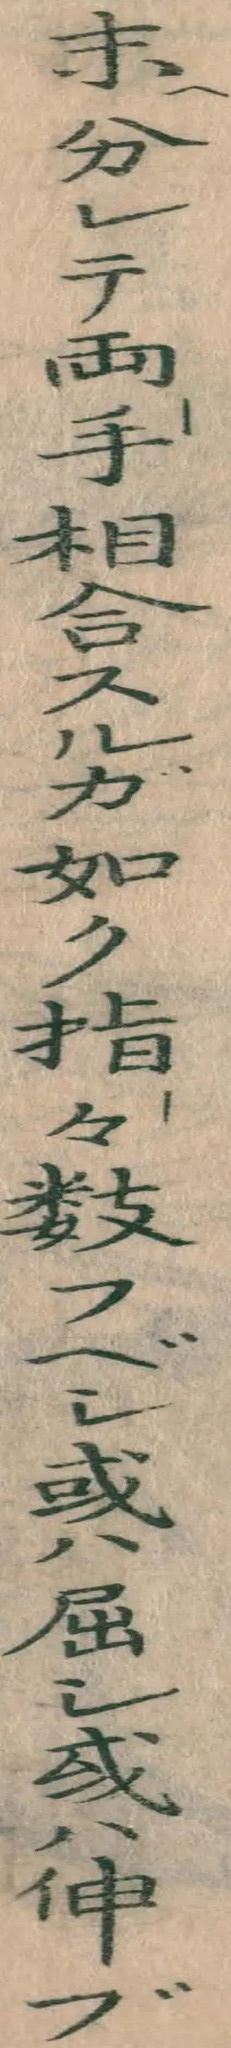末分レテ両-手相合スルガ如ク指-々数フベシ或ハ屈シ或ハ伸ブ
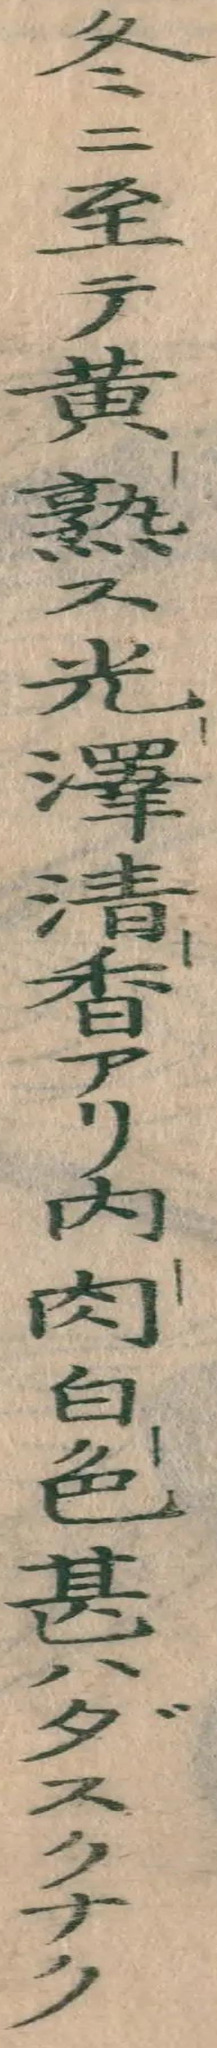冬ニ至テ黄-熟ス光-沢清-香アリ内-肉白-色甚ハダスクナク
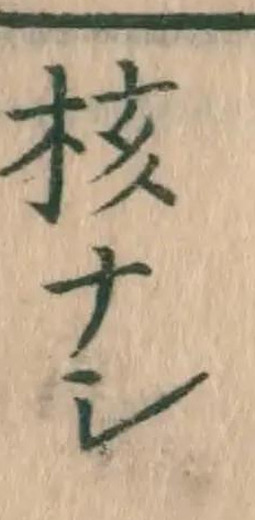核ナシ

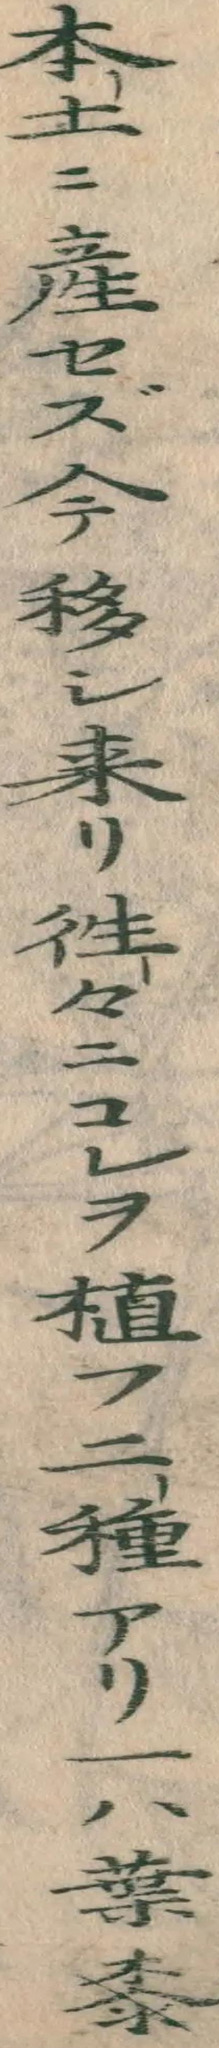本-土ニ産セズ今移シ来リ往-々ニコレヲ植フ二-種アリ一ハ葉桼
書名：花彙 草部4巻木部4巻. [2]
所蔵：国立国会図書館 National Diet Library, JAPAN
